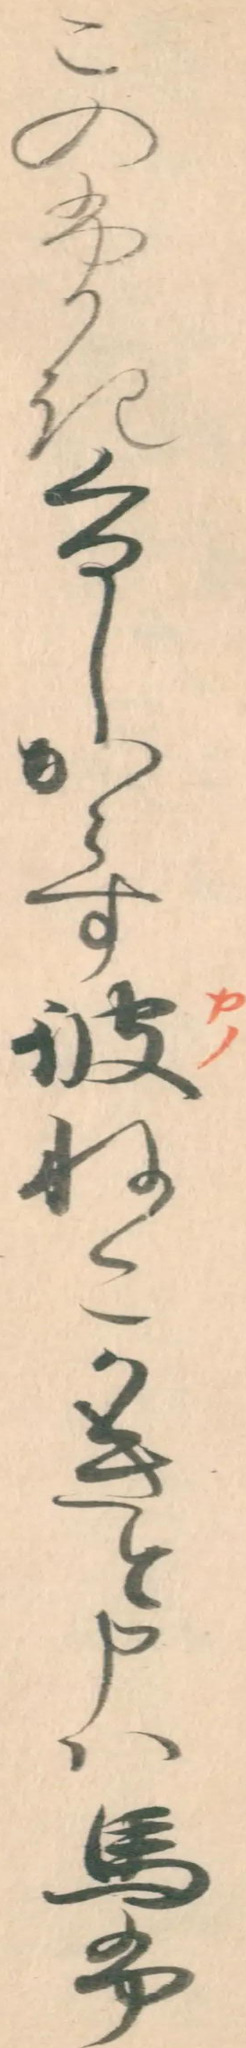このふかきくるしからす彼ねこかきと申は馬ふ
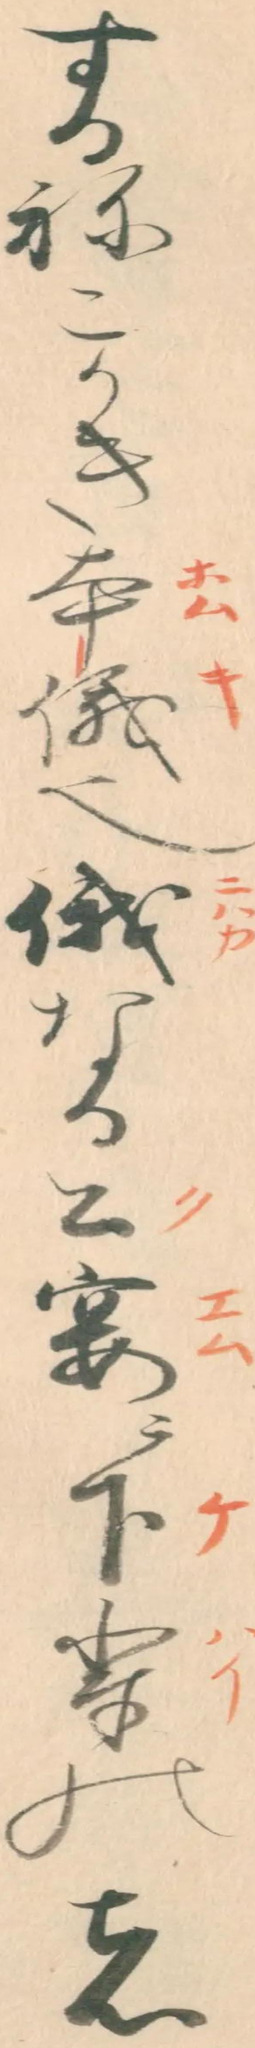するねこかき本儀也俄なる公宴に下輩の者
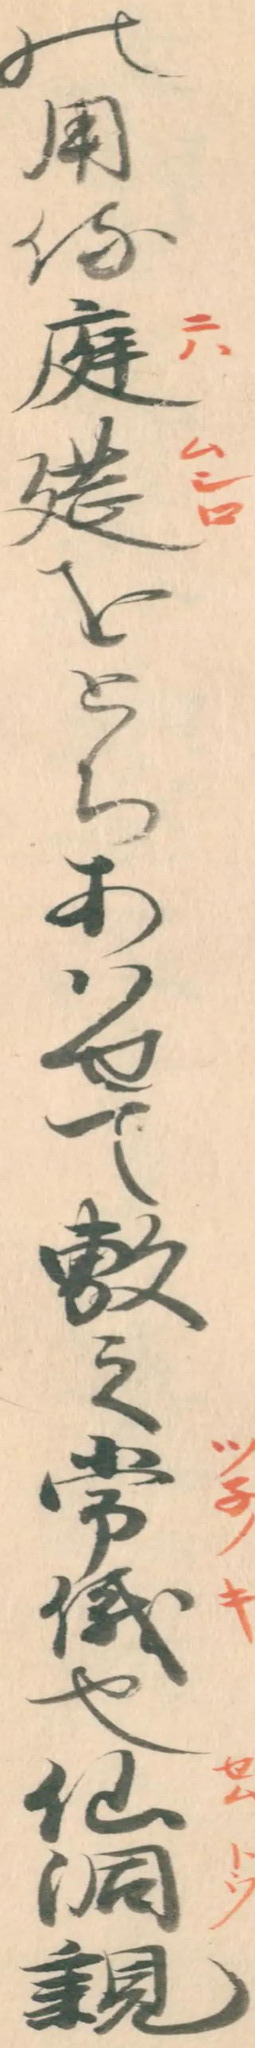の用侍庭莚をとちあはせて敷之常儀也仙洞親
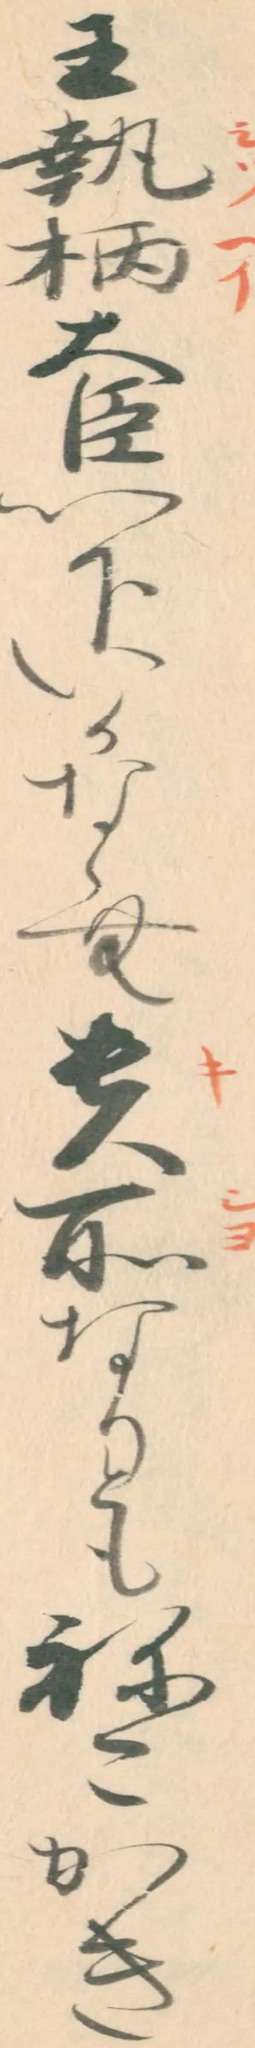王執柄大臣以下いかならむ貴所なりともねこかき
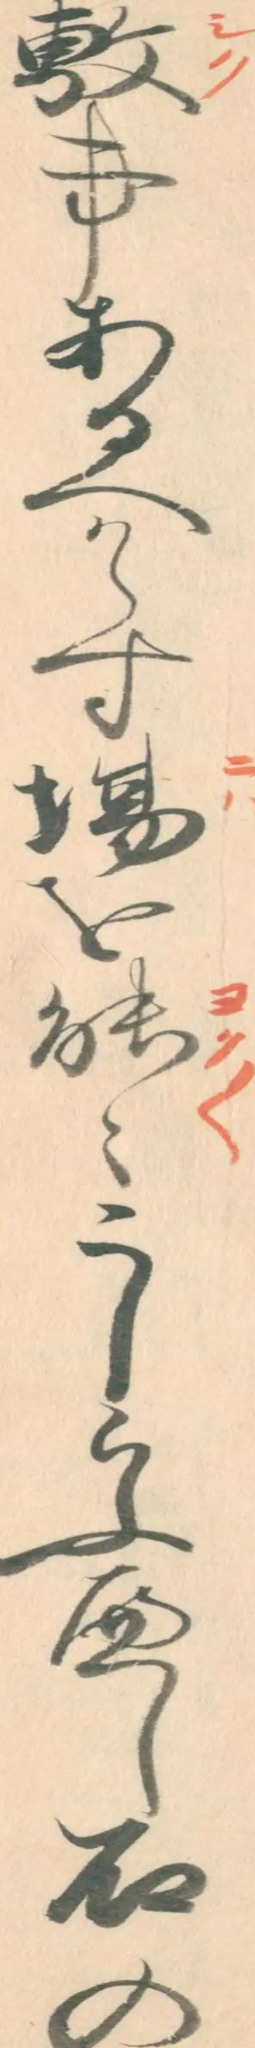敷事ありへからす塲を能々こしらふへし石の

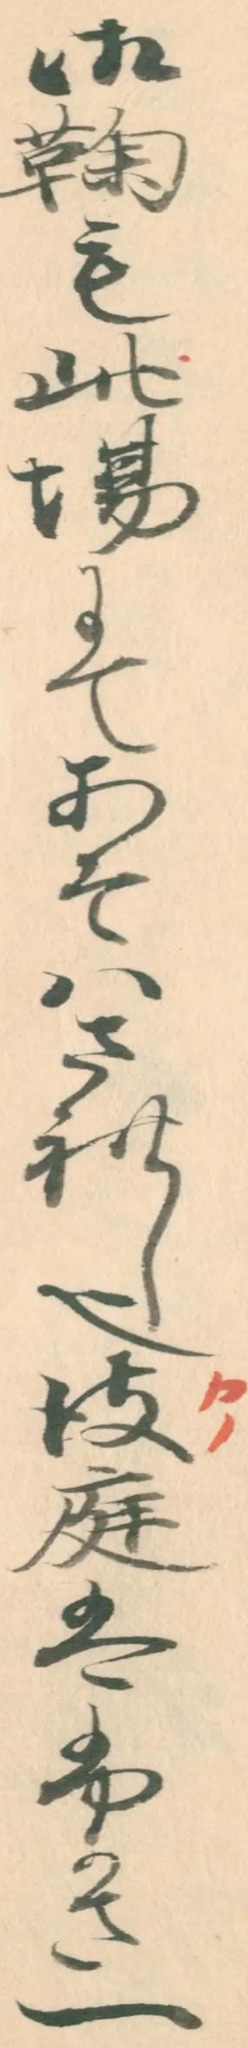御鞠も此場にてあそはされし也彼庭はふかさ一
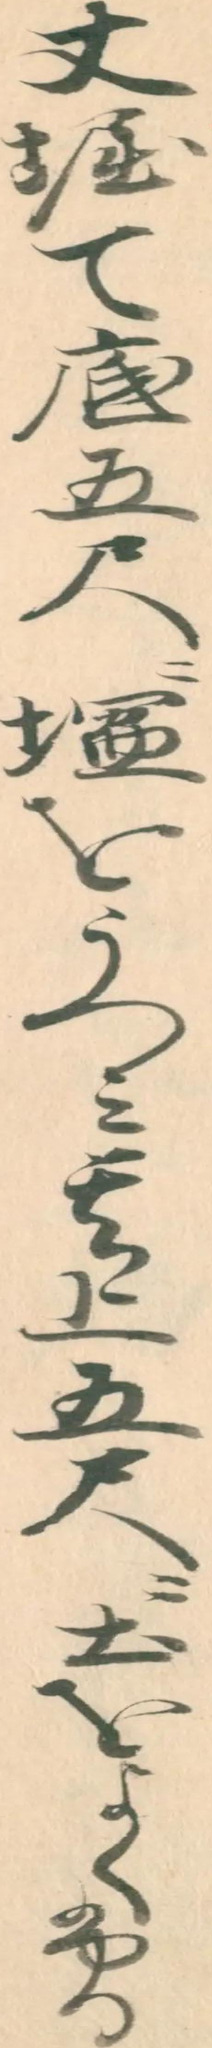丈堀て底五尺に塩をうつみ其上五尺に土をよくふる
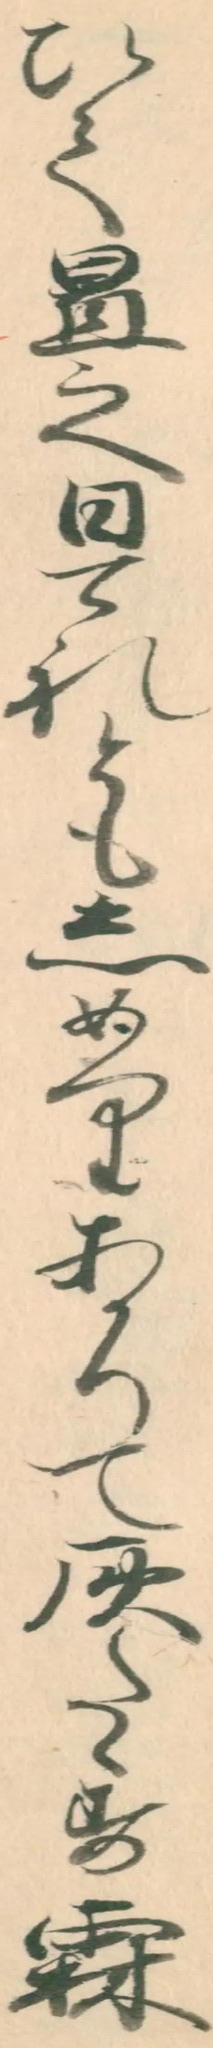ひて置之日てれともしめりあかりて灰たゝす霖
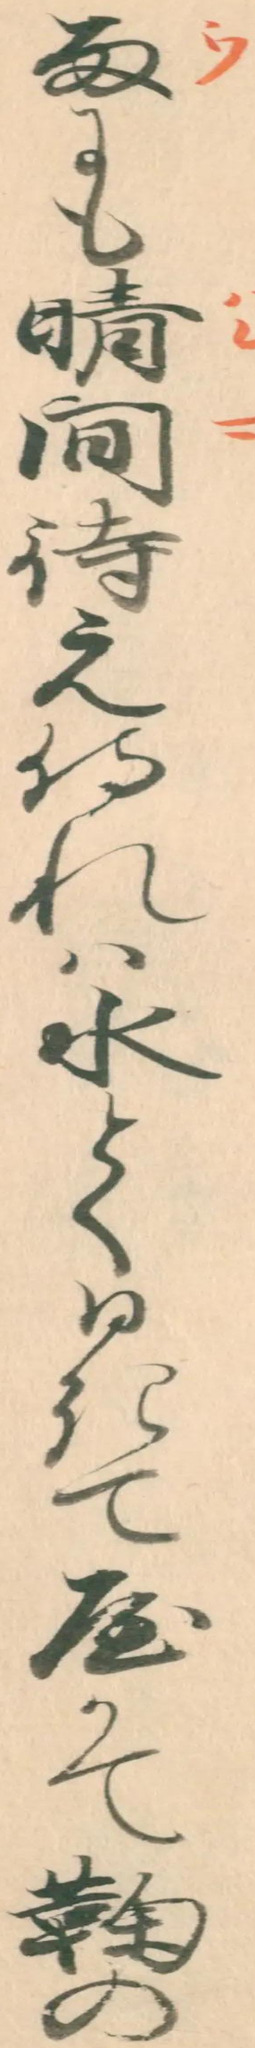雨にも晴間待え侍れは水とくひきてやかて鞠の
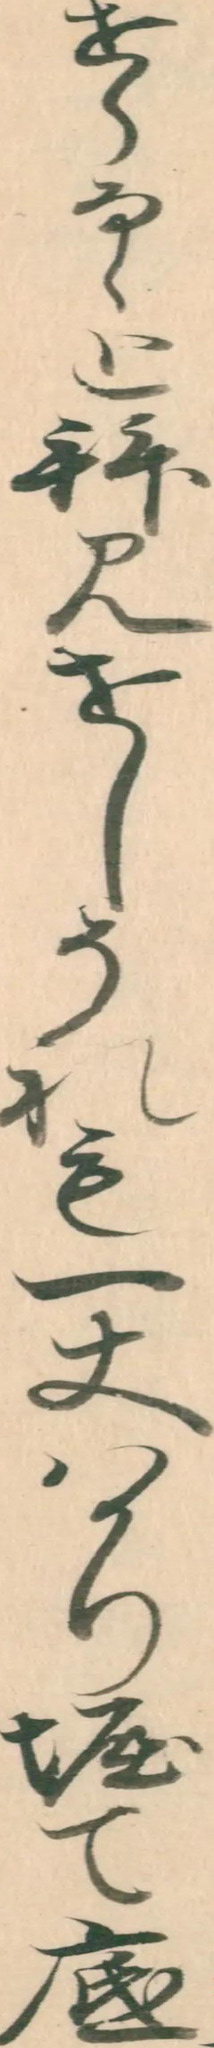せらるゝと拝見せしそれも一丈はかり堀て底に
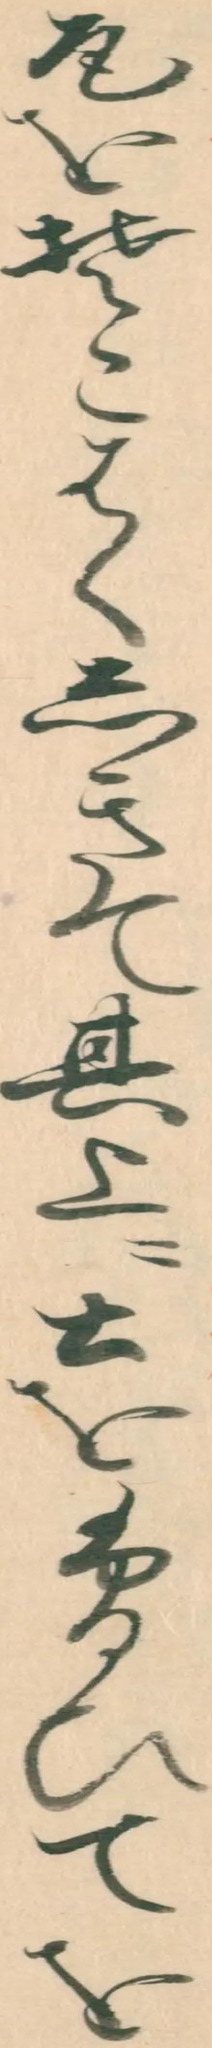瓦をそこはくしきて其上に土をふるひてを
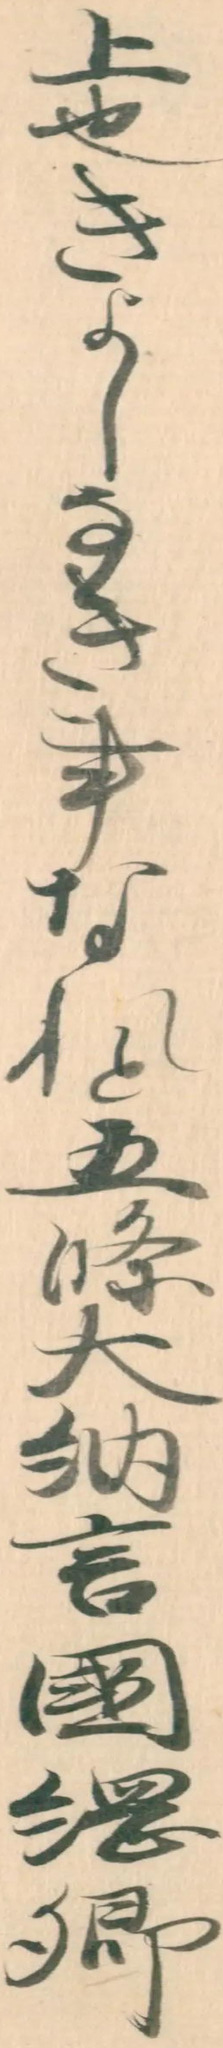上也きよしなき事なれと五條大納言國綱卿
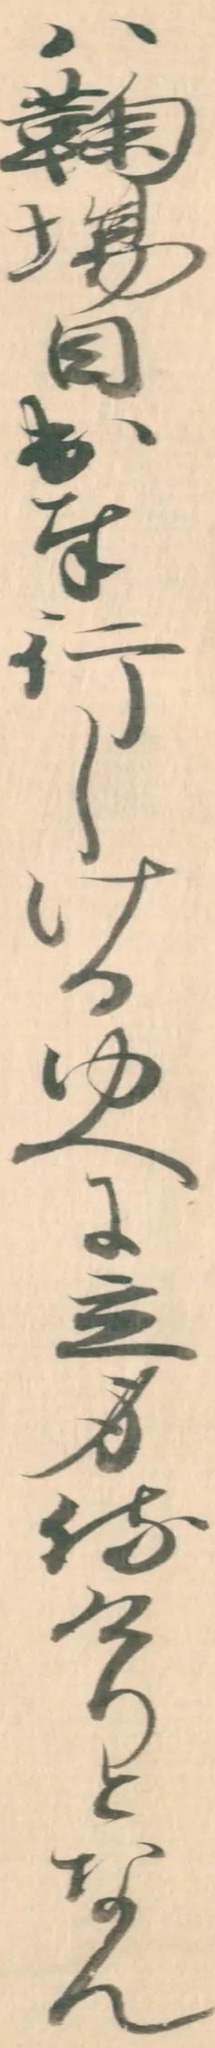は鞠場目出奉行しけるゆへに立身侍けりとなん
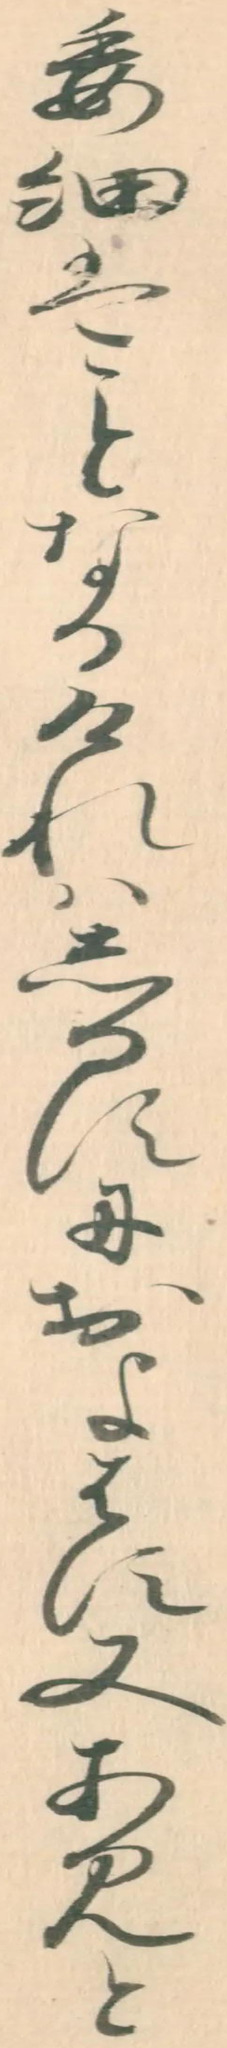委細はことなるけれはしるすにおよはす又あみと
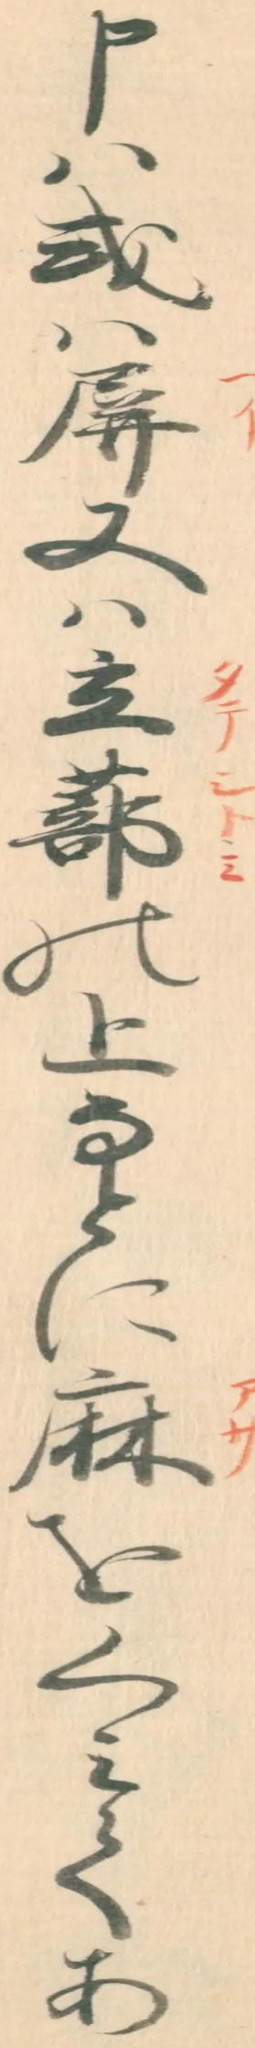申は或は屏又は立蔀の上なとに麻をくみてあ

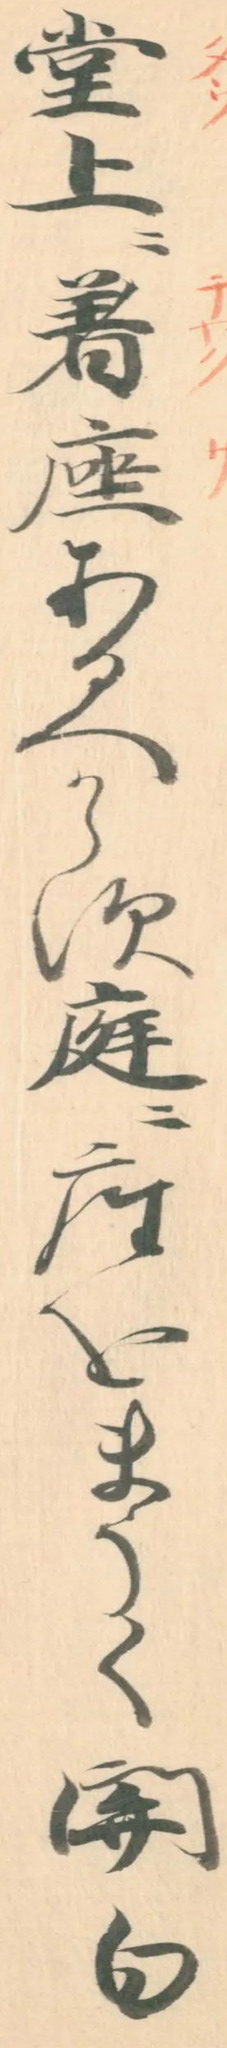堂上に着座あるへからす庭に座をまうく関白
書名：遊庭秘抄 2巻. [1]
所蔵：国立国会図書館 National Diet Library, JAPAN
